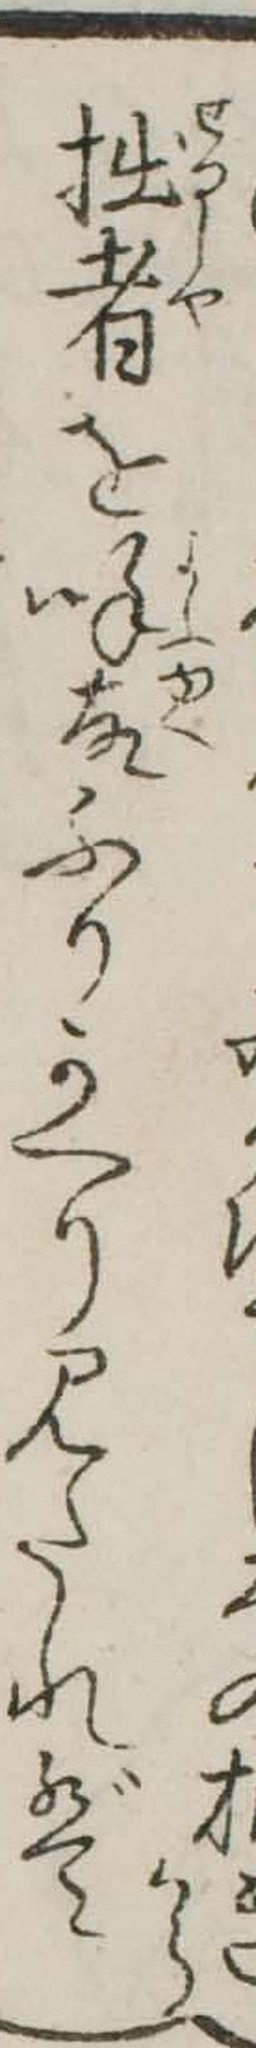拙者を呼故ふりかへり見たれば
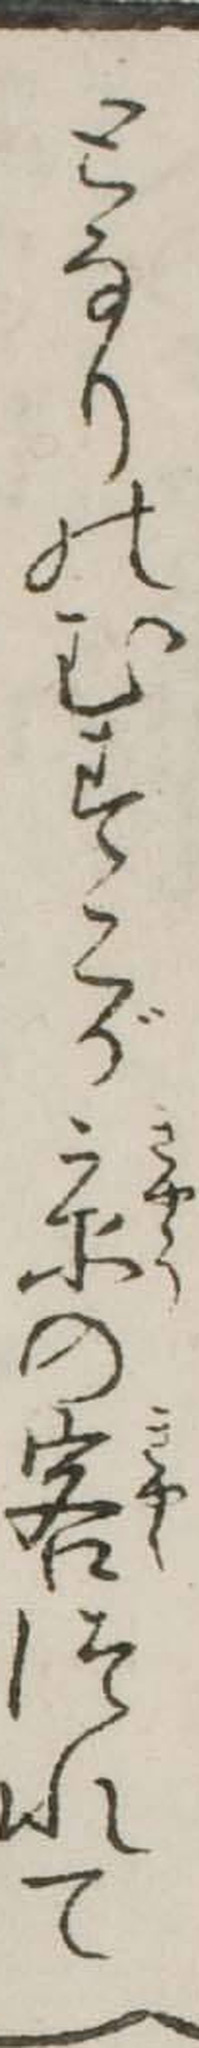となりのむすこが京の客つれて
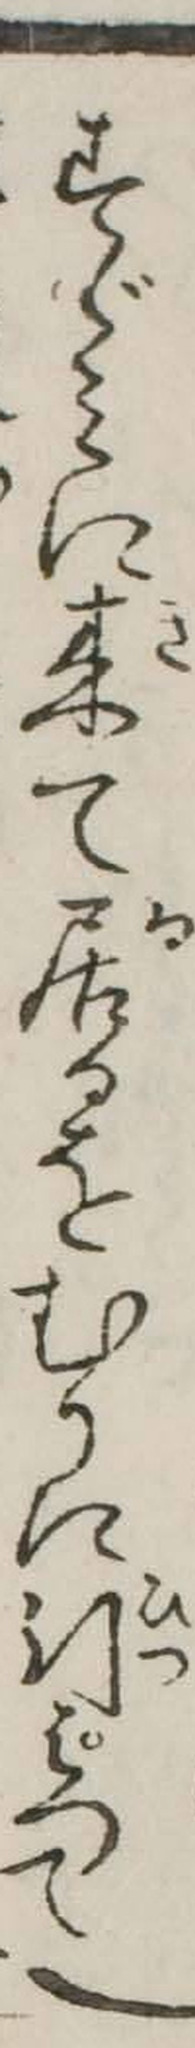すゞみに来て居るをむりに引ぱつて
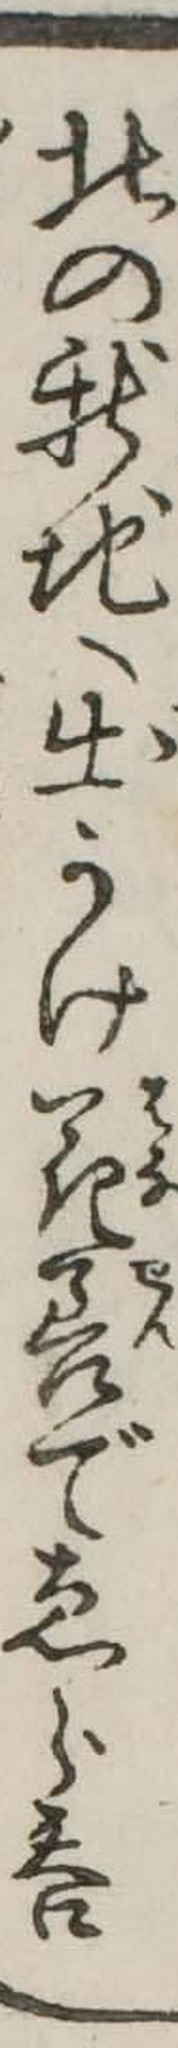北の新地へ出かけ花善でゑら吞
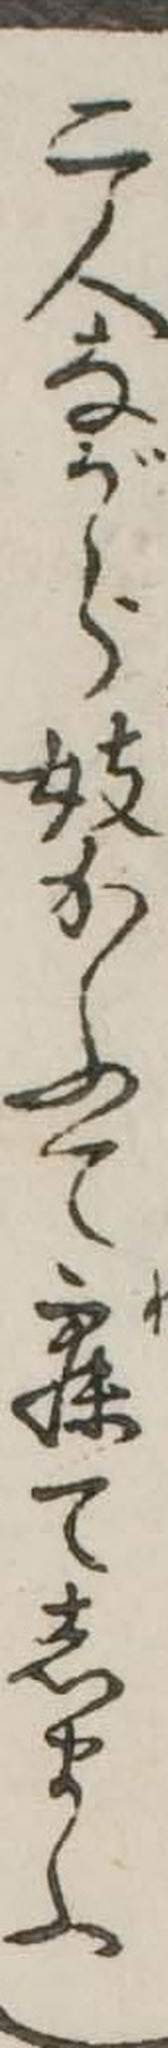二人ながら妓かふて寝てしまふ
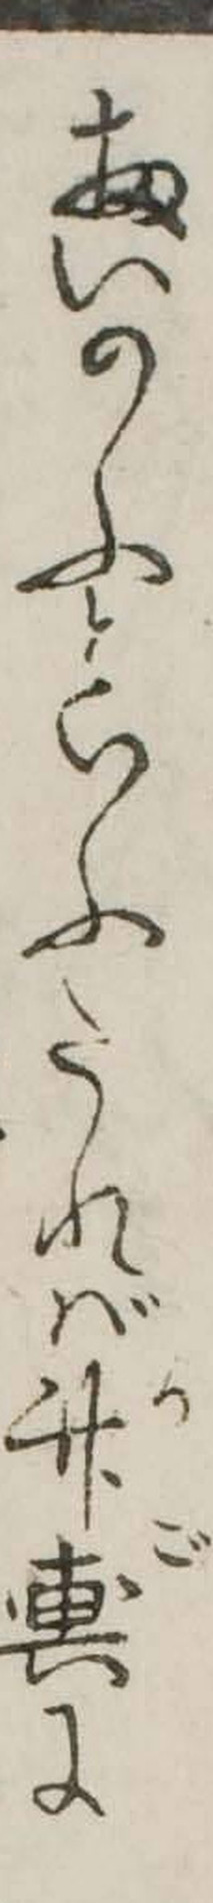扨いのふといふたれば竹輿に
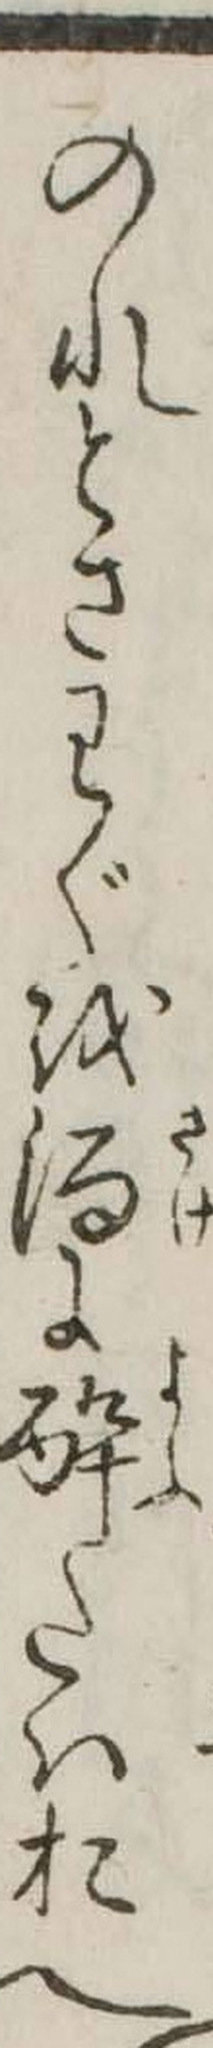のれとさわぐを酒に酔たはお
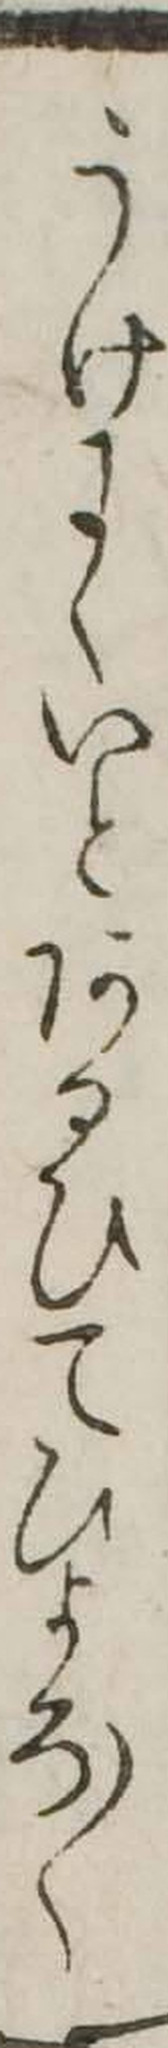うけにくいとあるひてひよろ〳〵
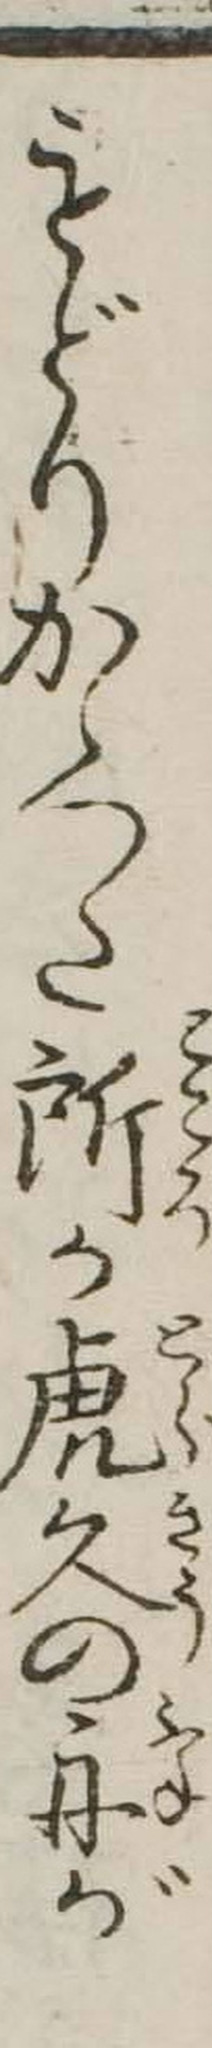もどりかゝつた所か虎久の舟が
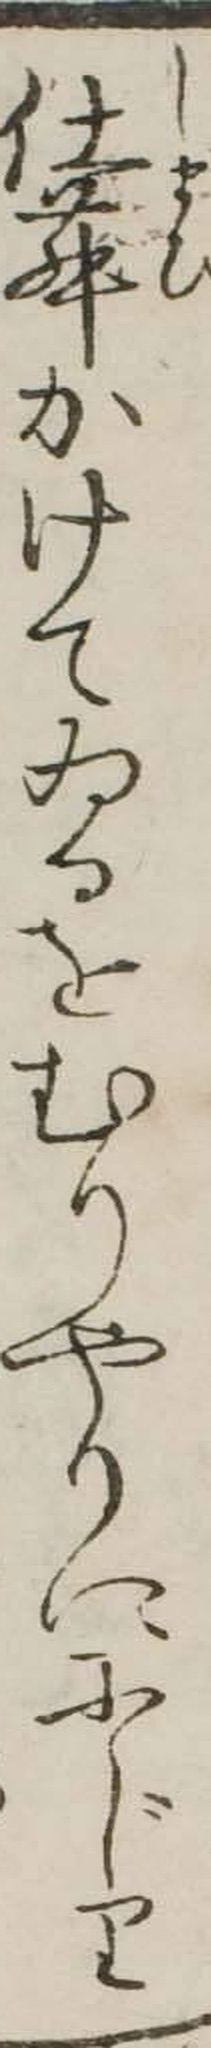仕舞かけてゐるをむりやりににじり
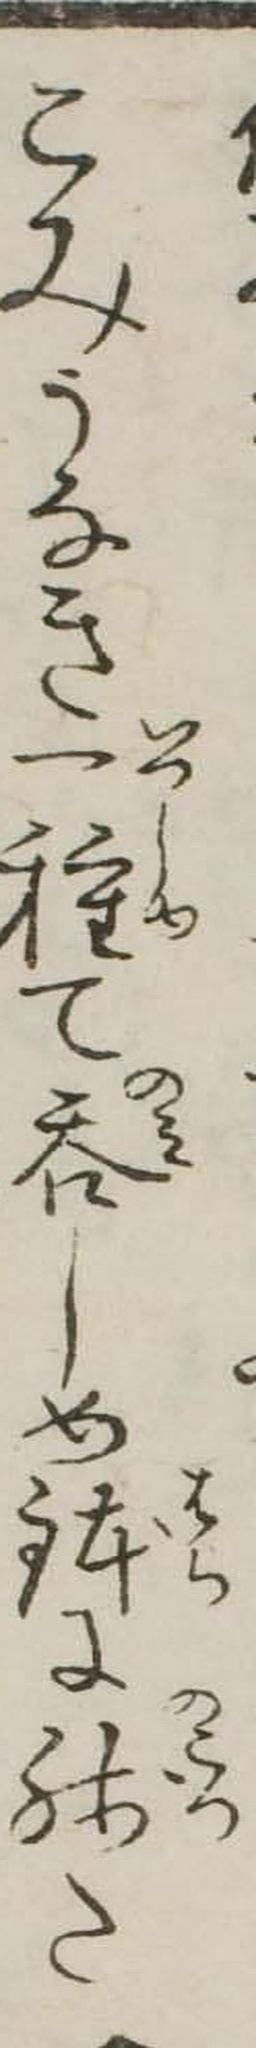こみうなき一種て呑しめ鉢に残た
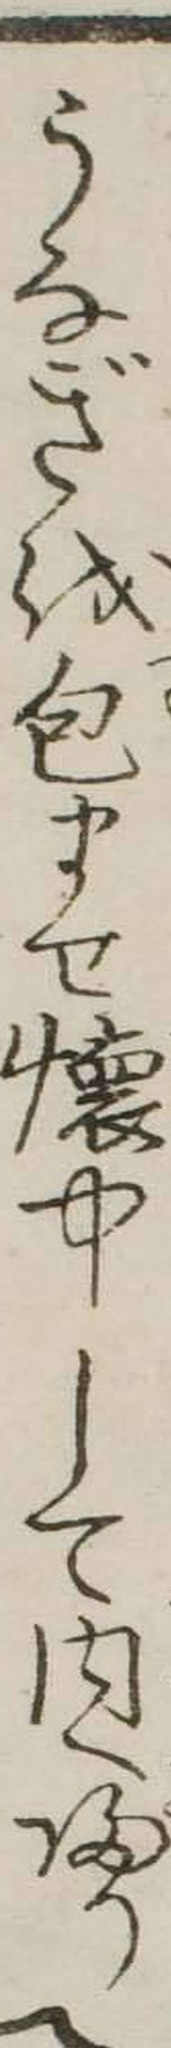うなぎを包ませ懐中して内へ帰り
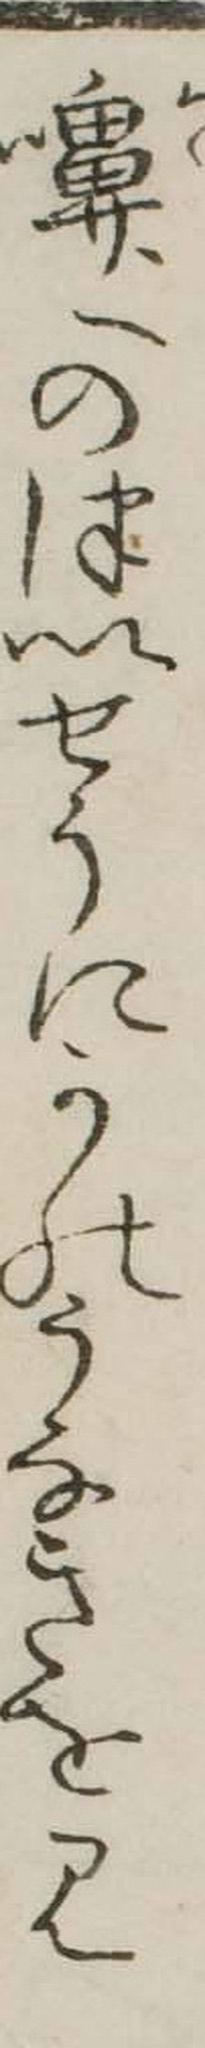嚊へのついせうにかのうなきを見
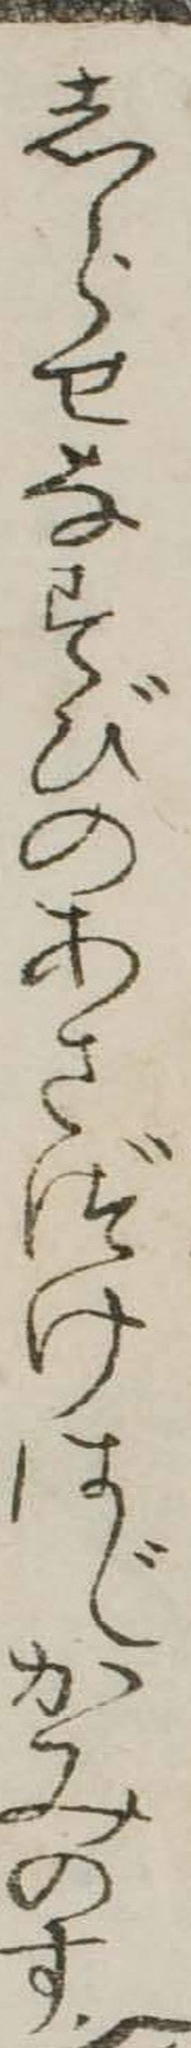しらせなすびのあさづけはじかみのす
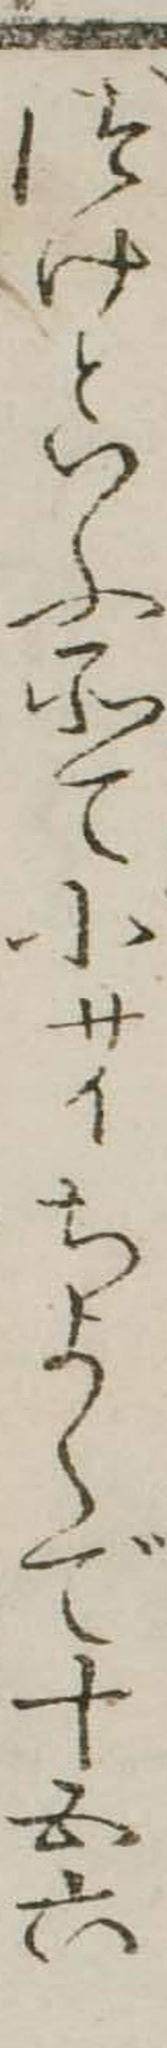づけといふ所て小サイちよくで十五六
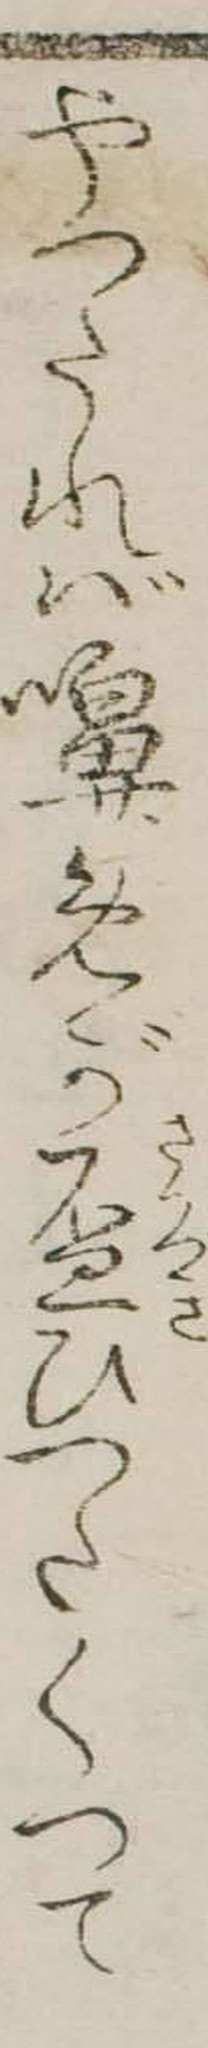やつたれば嚊めが盃ひつたくつて
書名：繪本不盡泉
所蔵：国文学研究資料館
